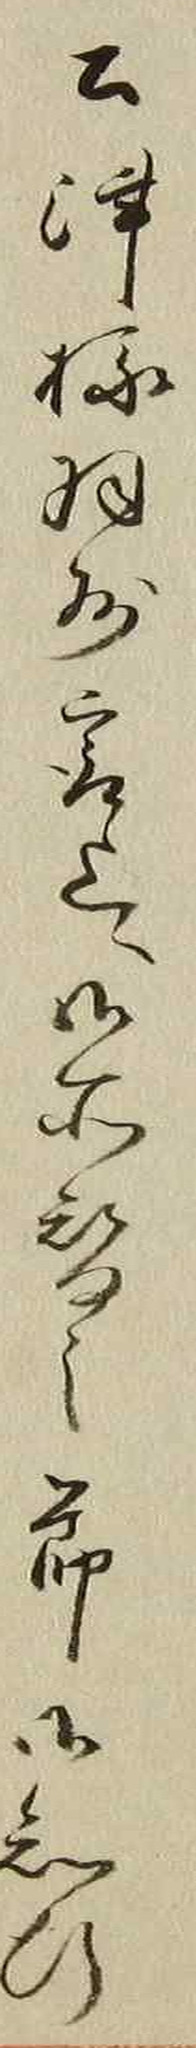土津様羽州最上へ御所替之節御知行
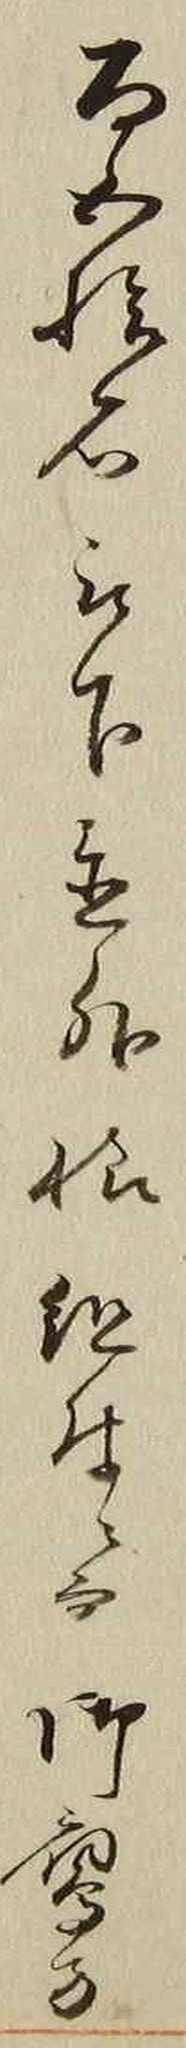百五拾石被下置外様組付ニ而御鷹方
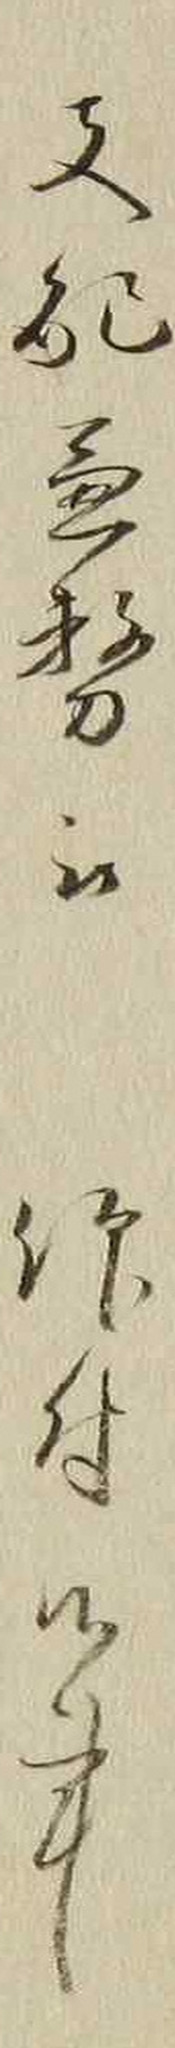支配兼務被仰付候事
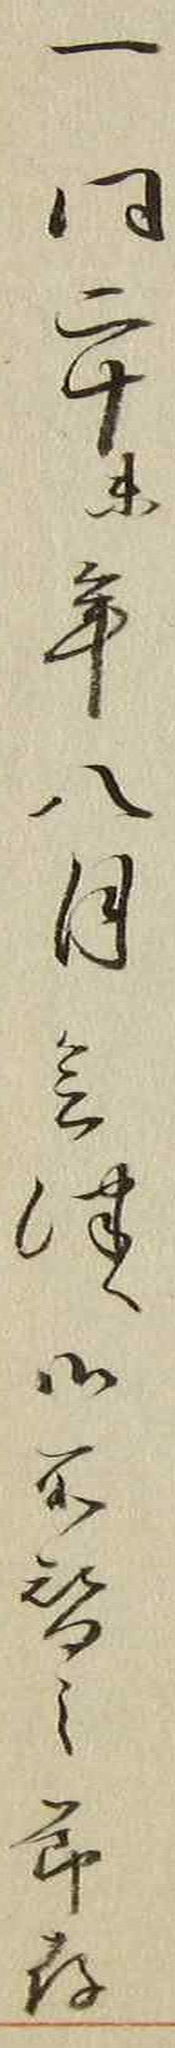一同二十未年八月会津へ御所替之節存
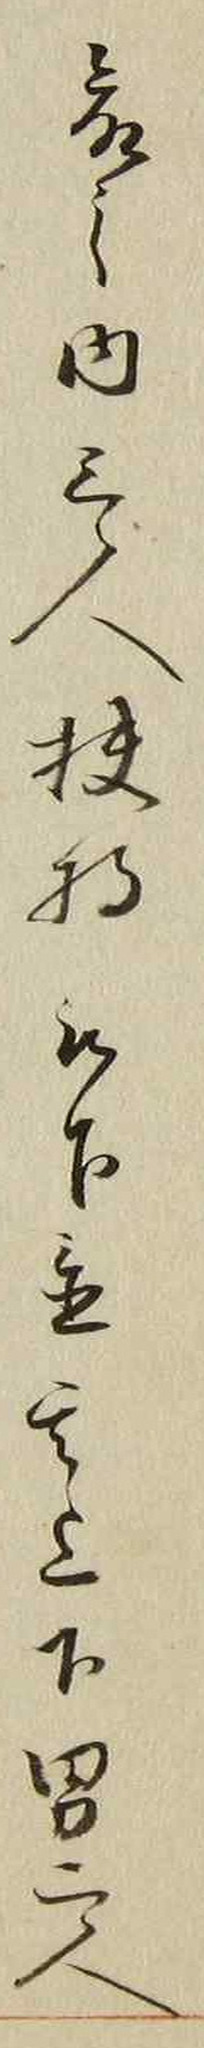命之内三人扶持被下置其上下男二人
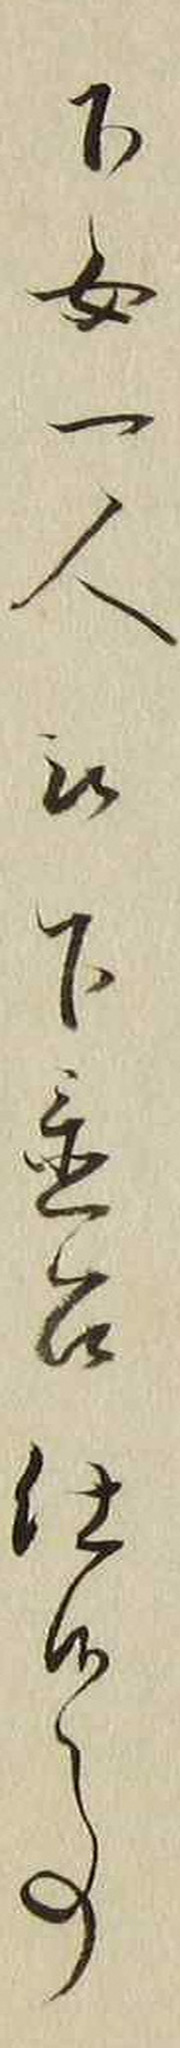下女一人被下置召仕候事
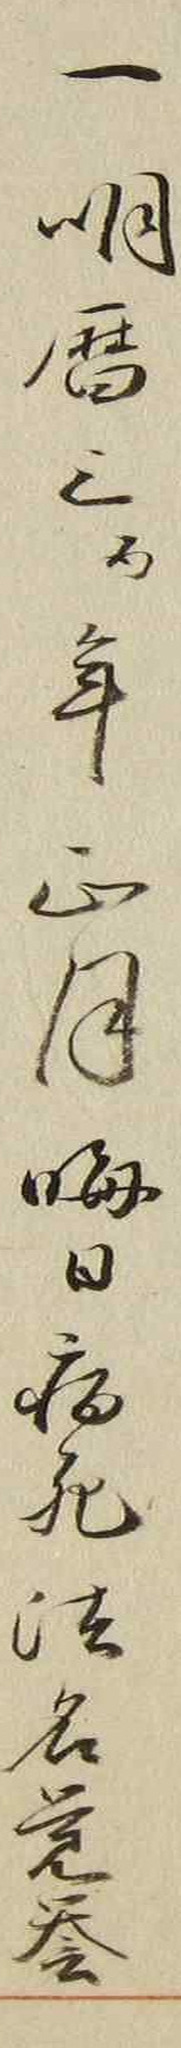一明暦三酉年正月晦日病死法名覚誉
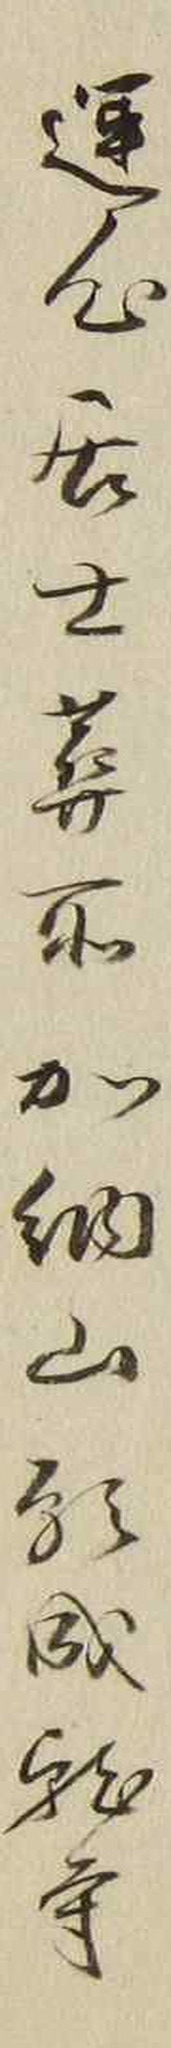運心居士葬所加納山願成就寺

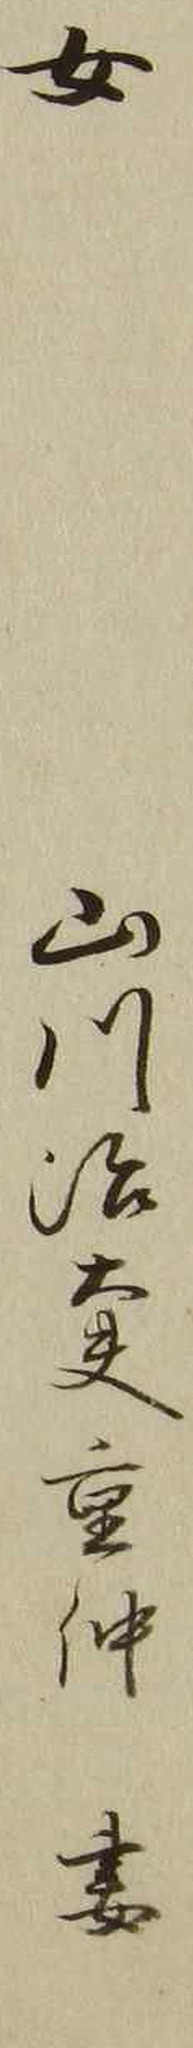女山川治大夫重仲妻
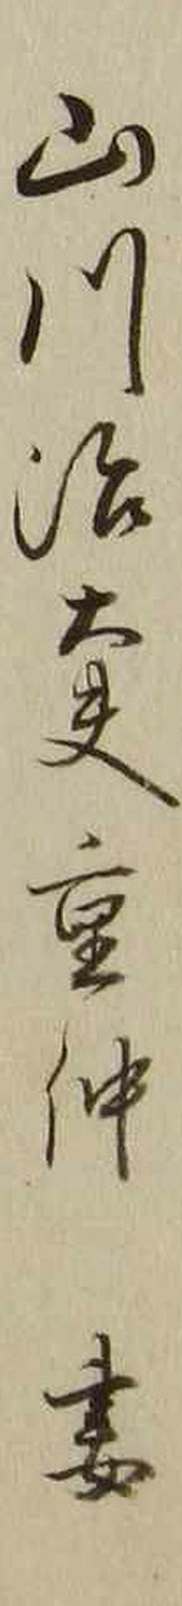女山川治大夫重仲妻
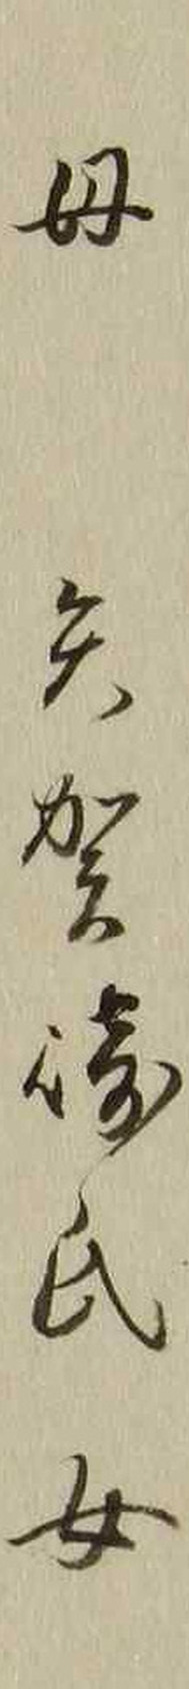母矢賀崎氏女
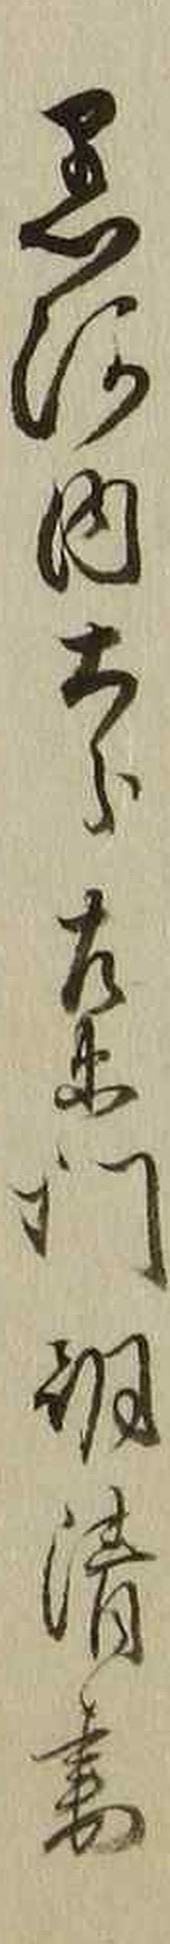女黒河内大郎左衛門朝清妻
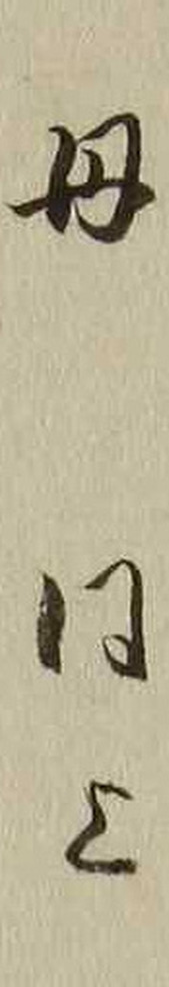母同上
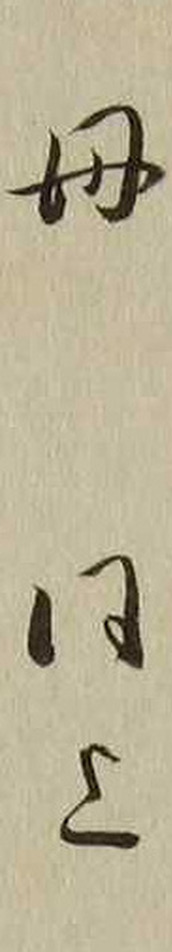母同上
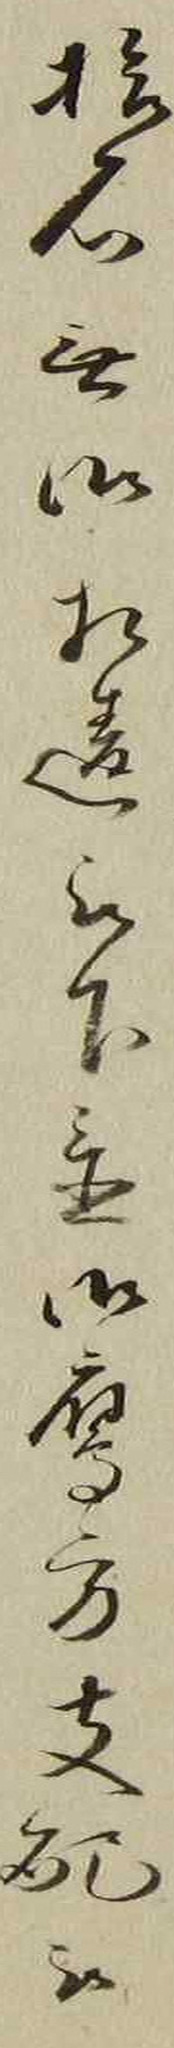拾石無御相違被下置御鷹方支配被
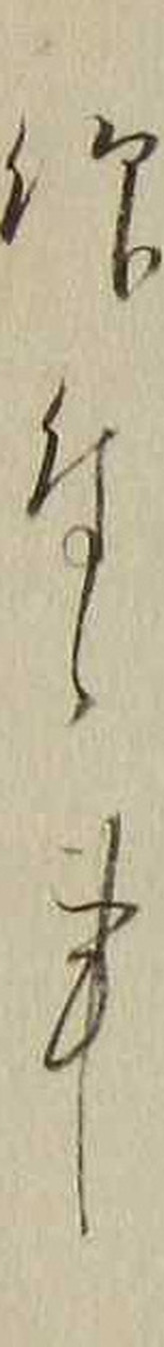仰付候事
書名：諸士系譜　巻之32　い之部32
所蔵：会津若松市立会津図書館
